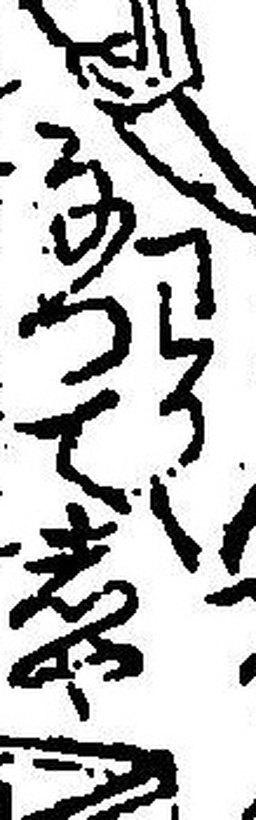なつてしや
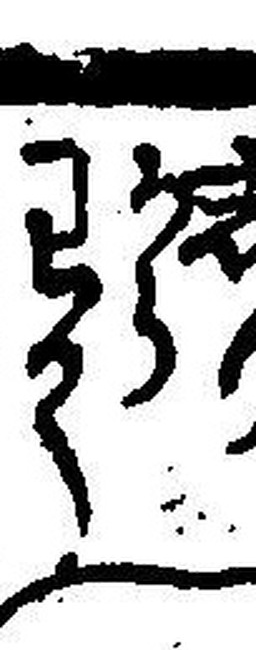わかく
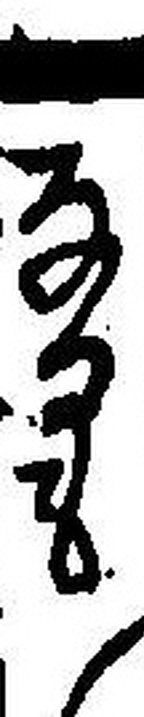なるも
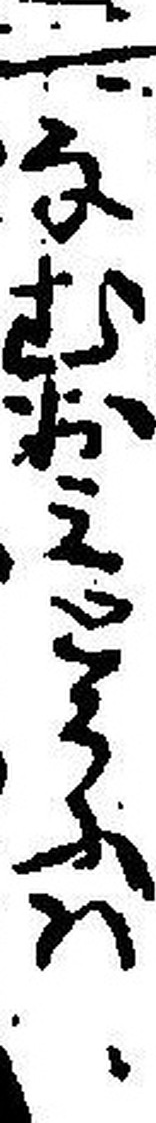なむおみとうふは
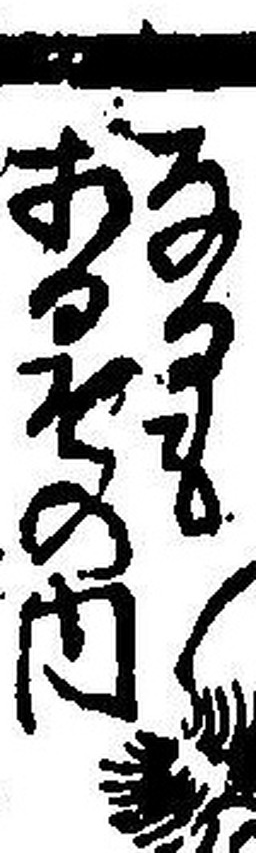あるその内
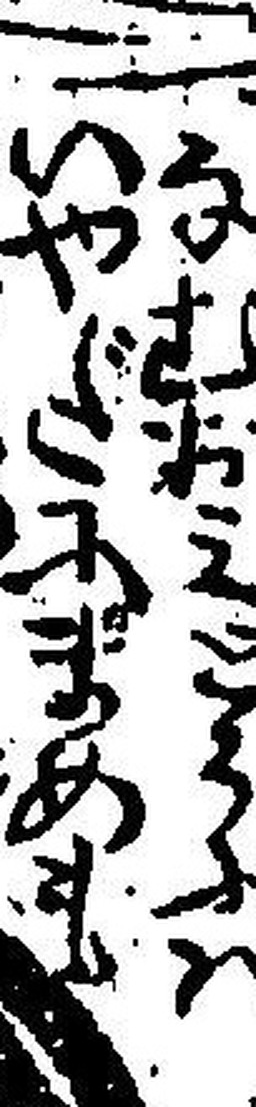いやだにまめも
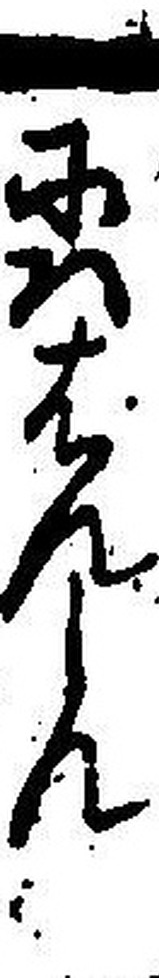にははんしん
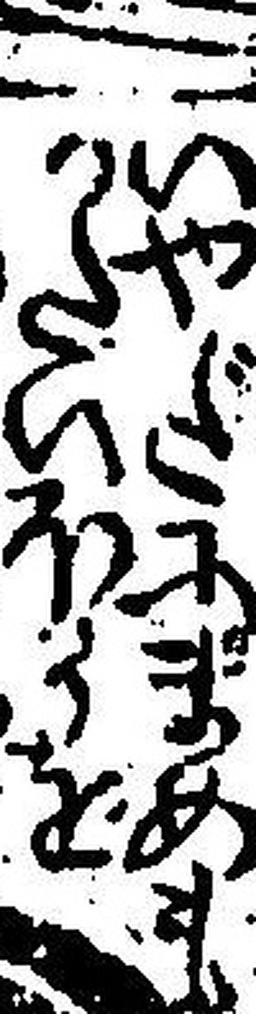かたいほうを
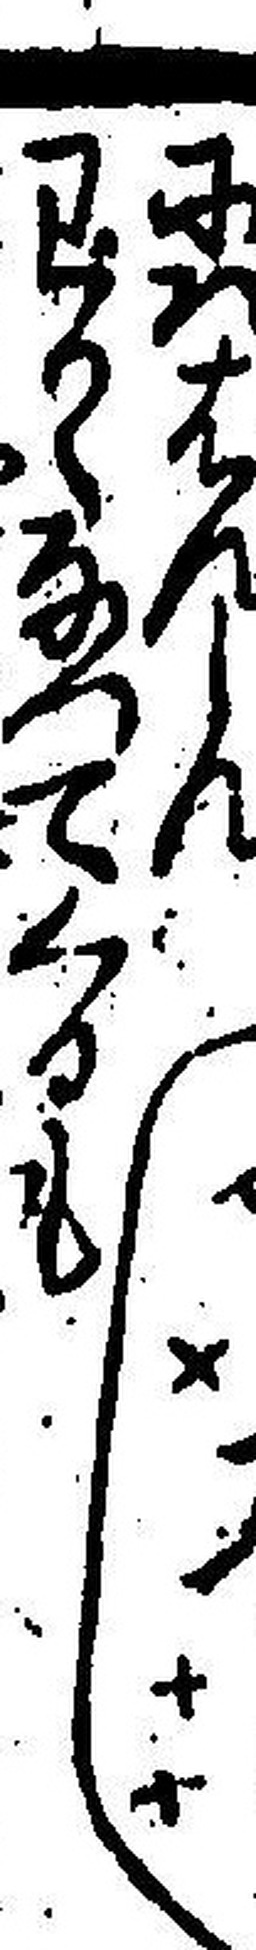わかくなつてくるも
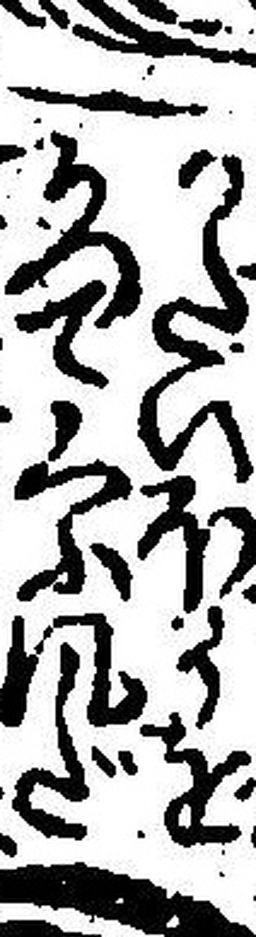かつてくふ風だ
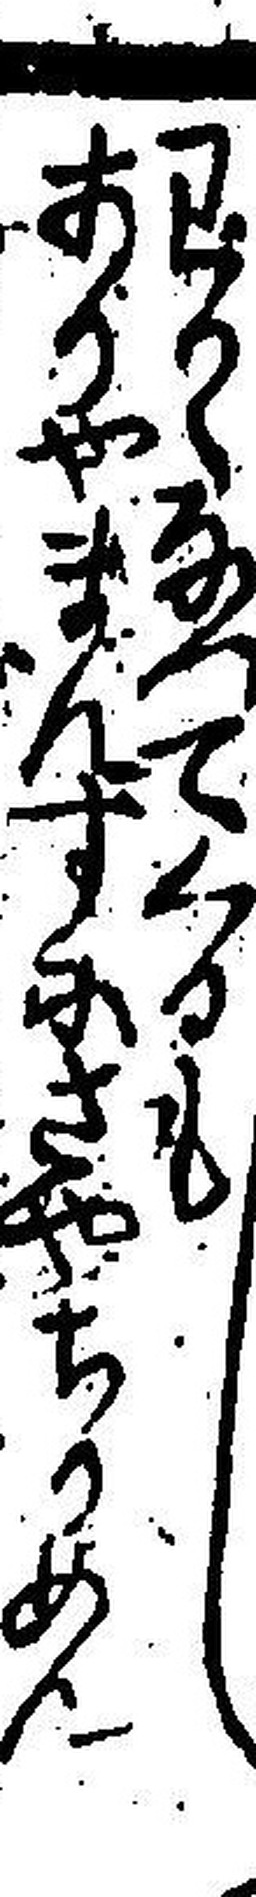おりやまんずふさやちりめん
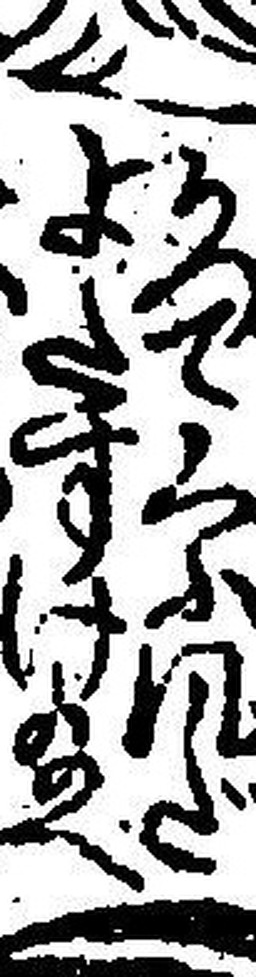よたすけ給へ
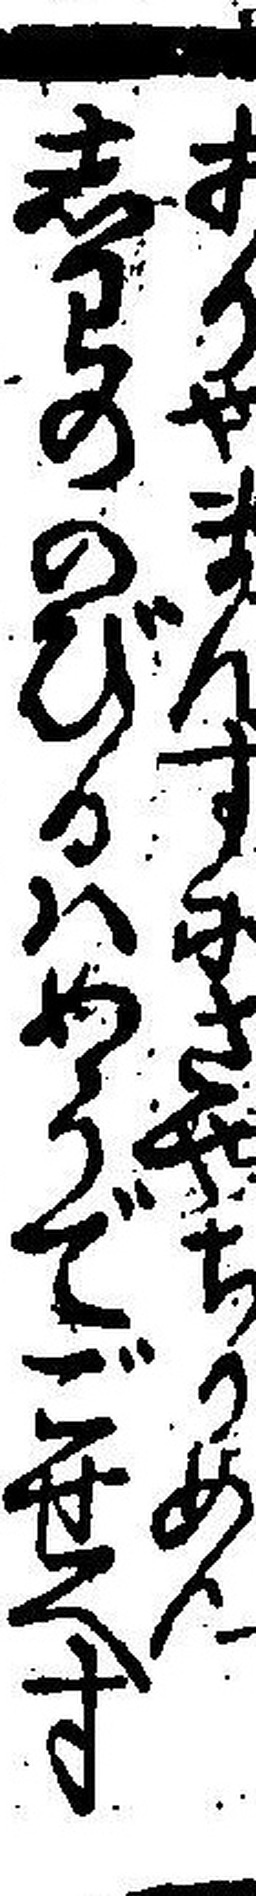しわののびるはめうでごせへす
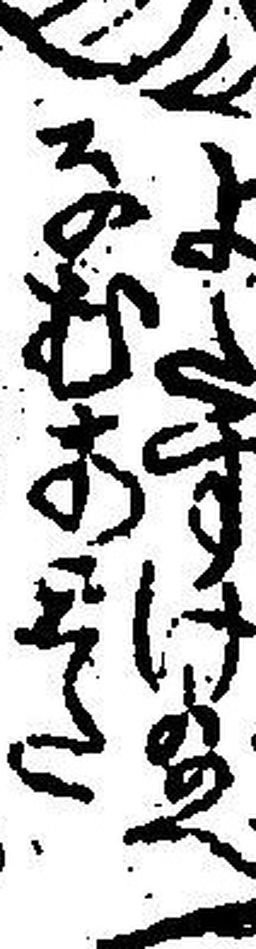なむあみた

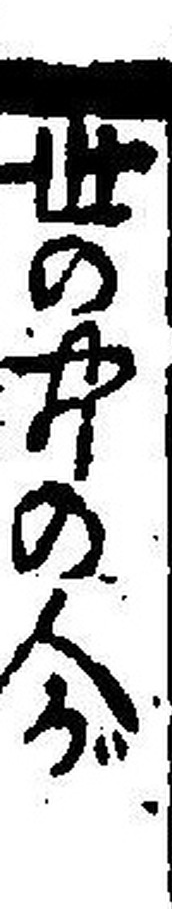世の中の人が
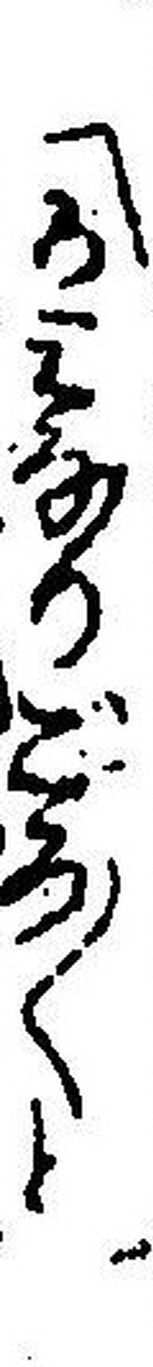〽かみなりごろ〳〵と
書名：徳若水縁起金性 / 樹下石上作
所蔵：東京大学総合図書館 General Library in the University of Tokyo, JAPAN
